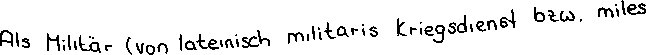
Als Militär (von lateinisch militaris Kriegsdienst bzw. miles
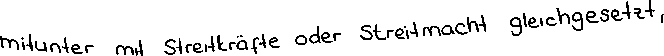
mitunter mit Streitkräfte oder Streitmacht gleichgesetzt,
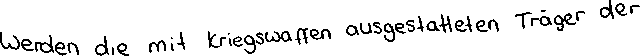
werden die mit Kriegswaffen ausgestatteten Träger der
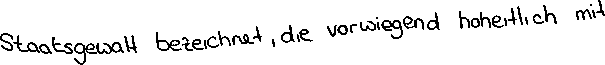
Staatsgewalt bezeichnet, die vorwiegend hoheitlich mit
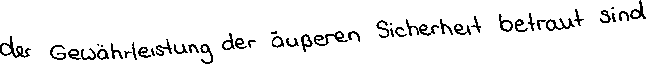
der Gewährleistung der äußeren Sicherheit betraut sind
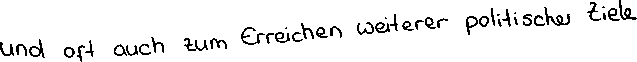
und oft auch zum Erreichen weiterer politischer Ziele
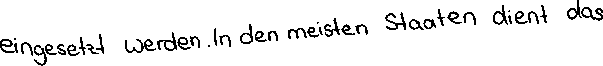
eingesetzt werden. In den meisten Staaten dient das
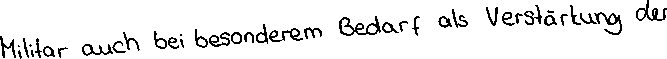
Militär auch bei besonderem Bedarf als Verstärkung der
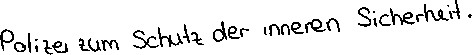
Polizei zum Schutz der inneren Sicherheit.
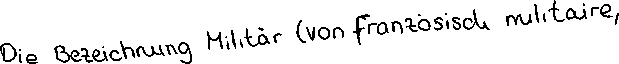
Die Bezeichnung Militär (von französisch militaire,
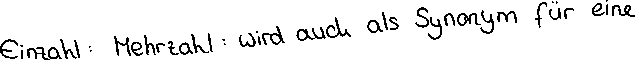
Einzahl: Mehrzahl: wird auch als Synonym für eine
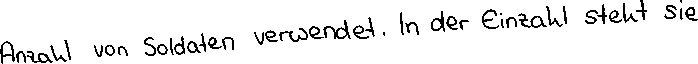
Anzahl von Soldaten verwendet. In der Einzahl steht sie
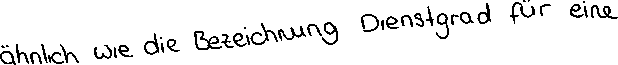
ähnlich wie die Bezeichnung Dienstgrad für eine
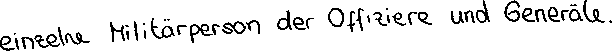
einzelne Militärperson der Offiziere und Generäle.
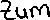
Zum
